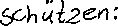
schützen:
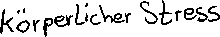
körperlicher Stress
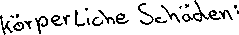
körperliche Schäden:
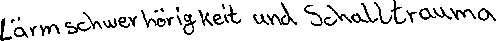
Lärmschwerhörigkeit und Schalltrauma
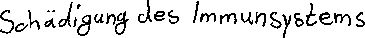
Schädigung des Immunsystems
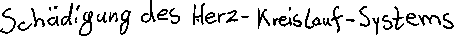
Schädigung des Herz-Kreislauf-Systems
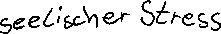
seelischer Stress
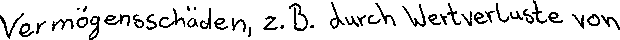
Vermögensschäden, z. B. durch Wertverluste von
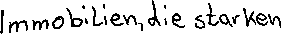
Immobilien, die starken
